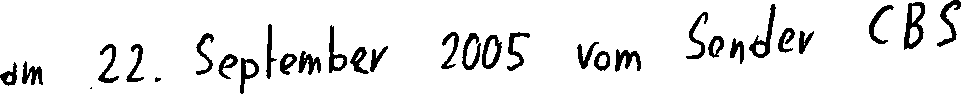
am 22. September 2005 vom Sender CBS
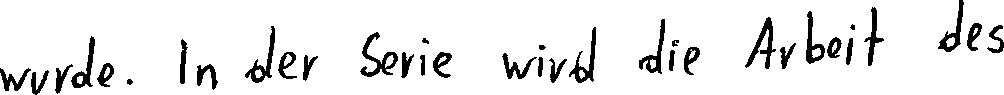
wurde. In der Serie wird die Arbeit des
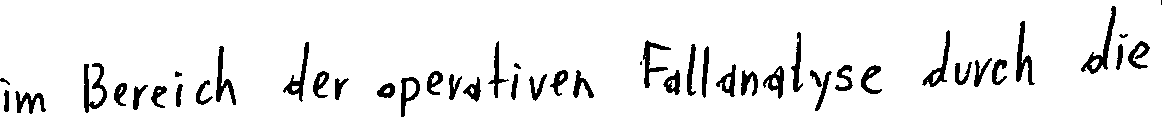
im Bereich der operativen Fallanalyse durch die
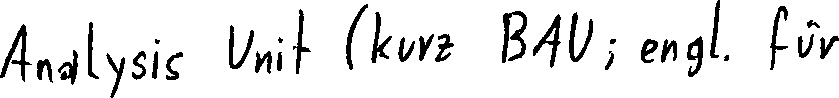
Analysis Unit (kurz BAU; engl. für
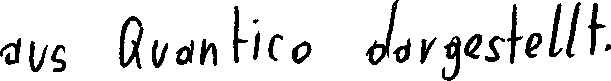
aus Quantico dargestellt.
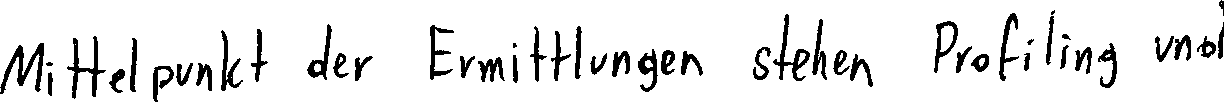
Mittelpunkt der Ermittlungen stehen Profiling und
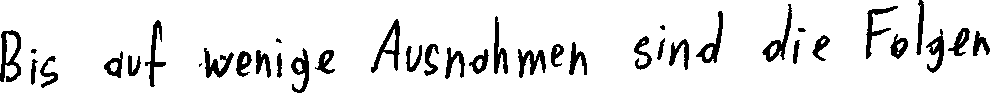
Bis auf wenige Ausnahmen sind die Folgen
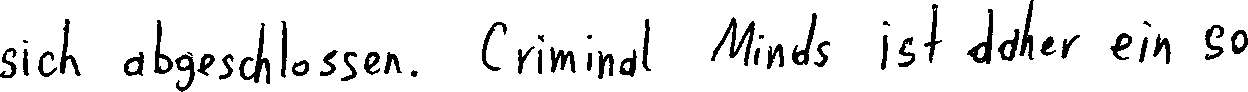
sich abgeschlossen. Criminal Minds ist daher ein so
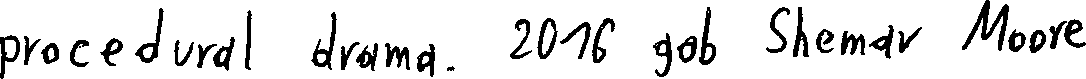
procedural drama. 2016 gab Shemar Moore
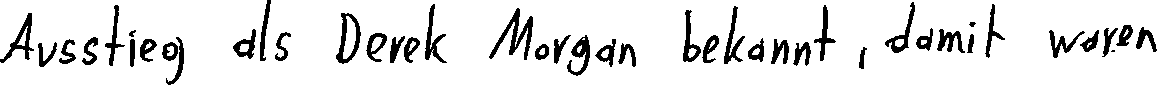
Ausstieg als Derek Morgan bekannt, damit waren
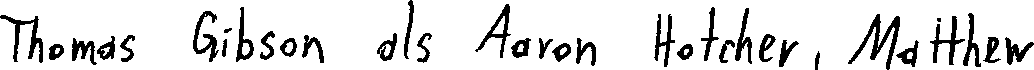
Thomas Gibson als Aaron Hotchner, Matthew
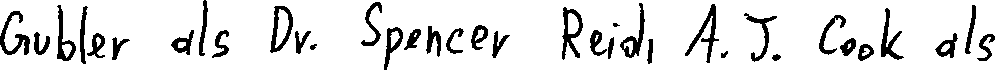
Gubler als Dr. Spencer Reid, A. J. Cook als
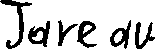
Jareau
